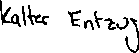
Kalter Entzug
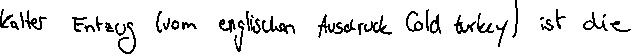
Kalter Entzug (vom englischen Ausdruck Cold turkey) ist die
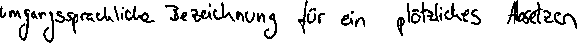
umgangssprachliche Bezeichnung für ein plötzliches Absetzen
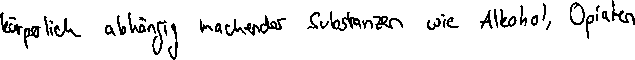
körperlich abhängig machender Substanzen wie Alkohol, Opiaten
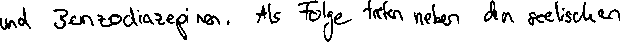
und Benzodiazepinen. Als Folge treten neben den seelischen
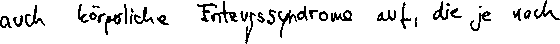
auch körperliche Entzugssyndrome auf, die je nach
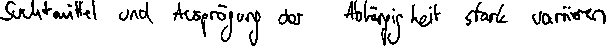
Suchtmittel und Ausprägung der Abhängigkeit stark variieren
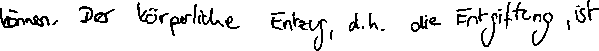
können. Der körperliche Entzug, d. h. die Entgiftung, ist
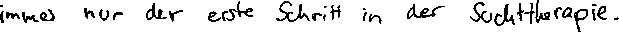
immer nur der erste Schritt in der Suchttherapie.
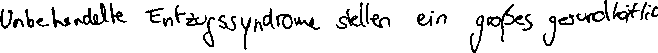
Unbehandelte Entzugssyndrome stellen ein großes gesundheitliches
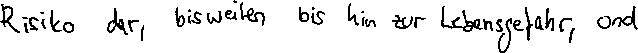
Risiko dar, bisweilen bis hin zur Lebensgefahr, und
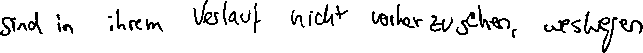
sind in ihrem Verlauf nicht vorherzusehen, weswegen
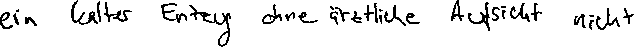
ein kalter Entzug ohne ärztliche Aufsicht nicht
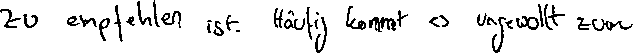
Zu empfehlen ist. Häufig kommt es ungewollt zum
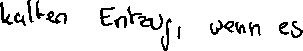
kalten Entzug, wenn es
